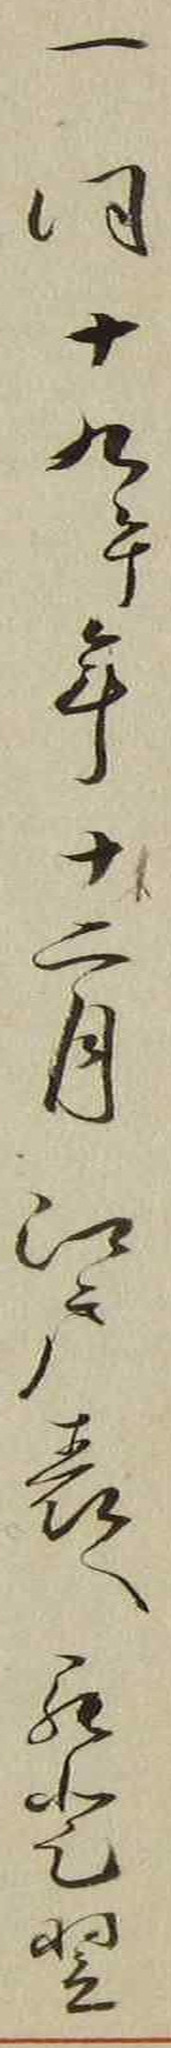一同十九午年十二月江戸表へ罷登翌
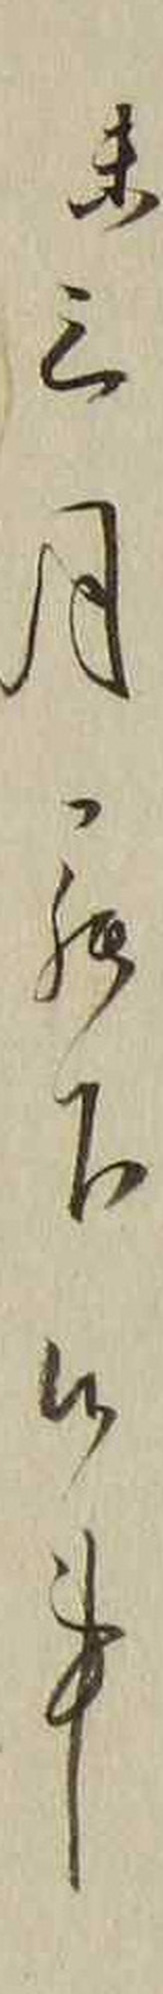未三月罷下候事

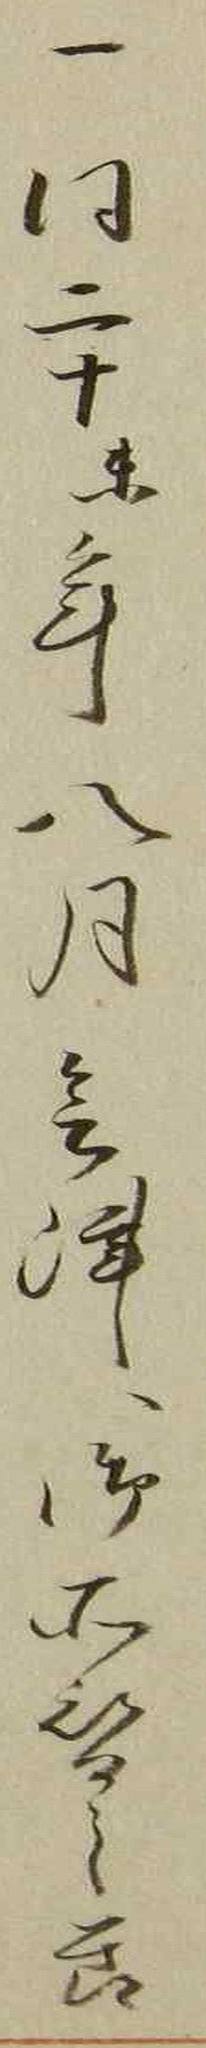一同二十未年八月会津へ御所替之節
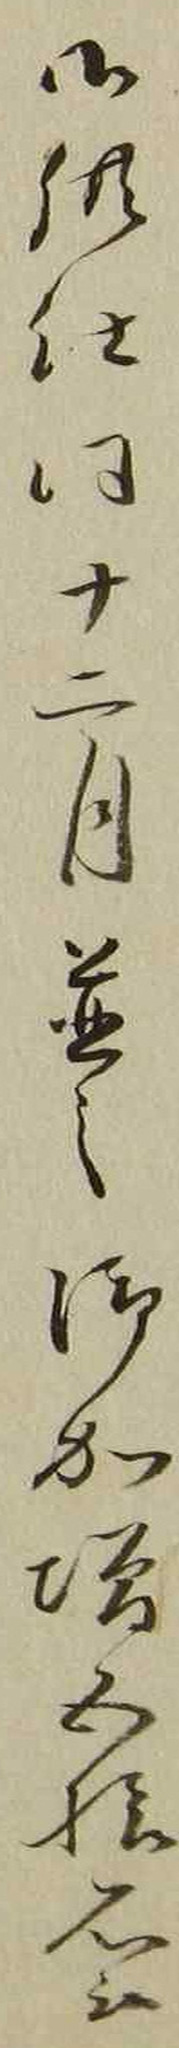御供仕同十二月並之御加増五拾石被
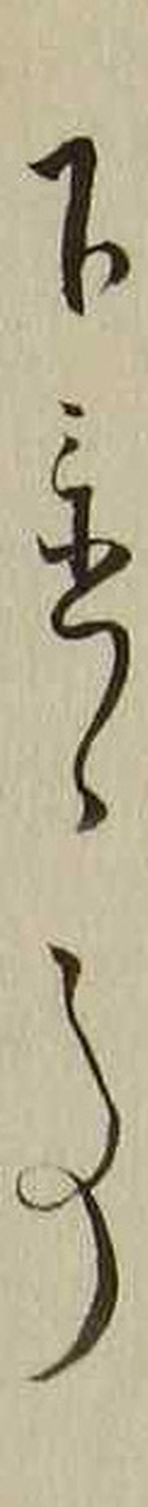下置候事
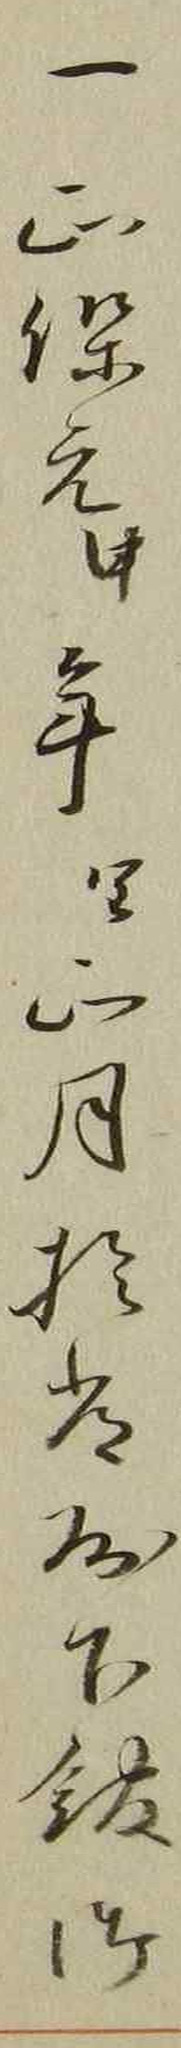一正保元申年閏正月於常殿下館御
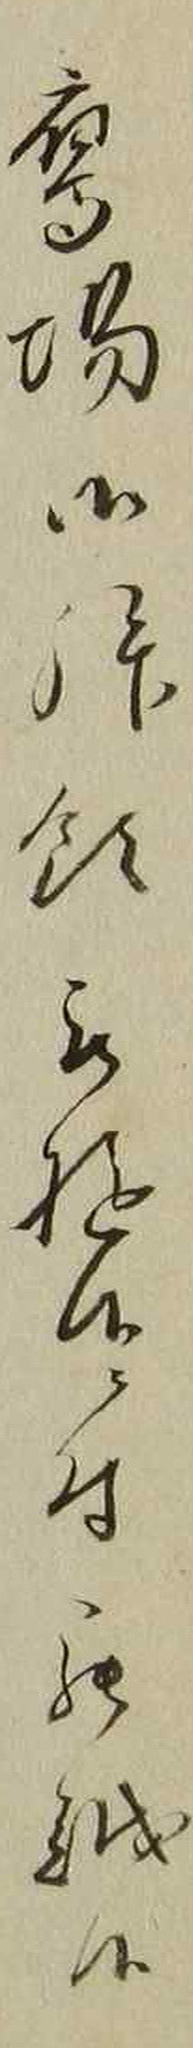鷹場御拝領被遊候ニ付罷越候
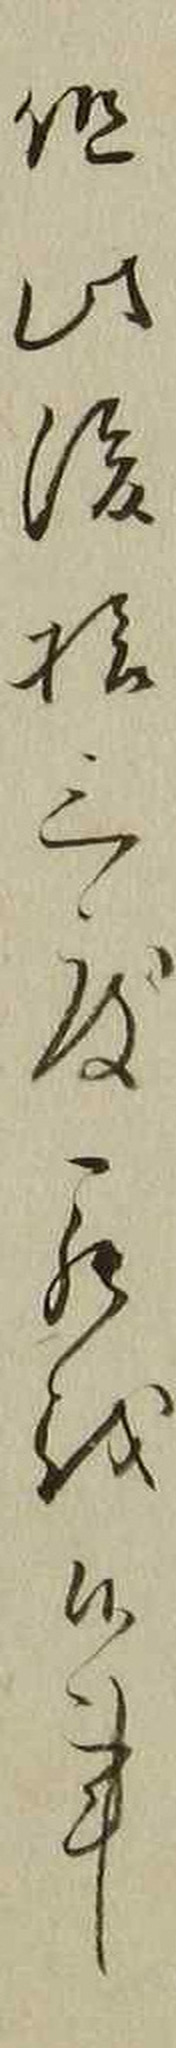但此後拾三度罷越候事
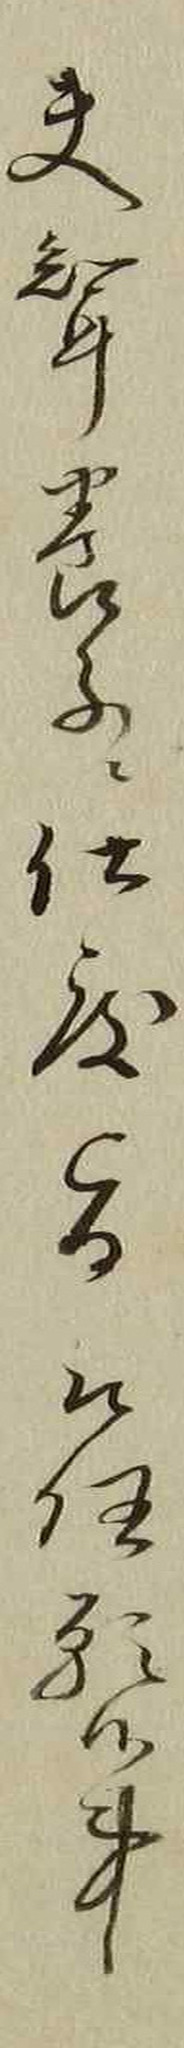夫聟養子ニ仕度旨被任願候事
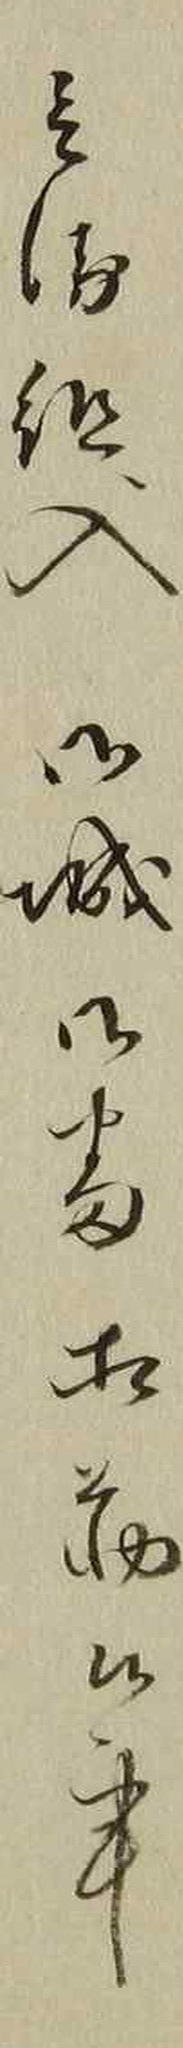兵衛組へ入御城御番相勤候事
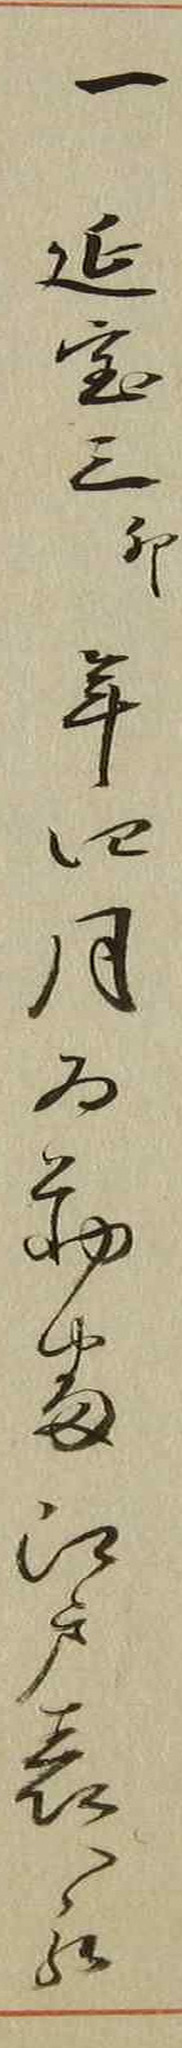一延宝三卯年四月為勤番江戸表へ罷
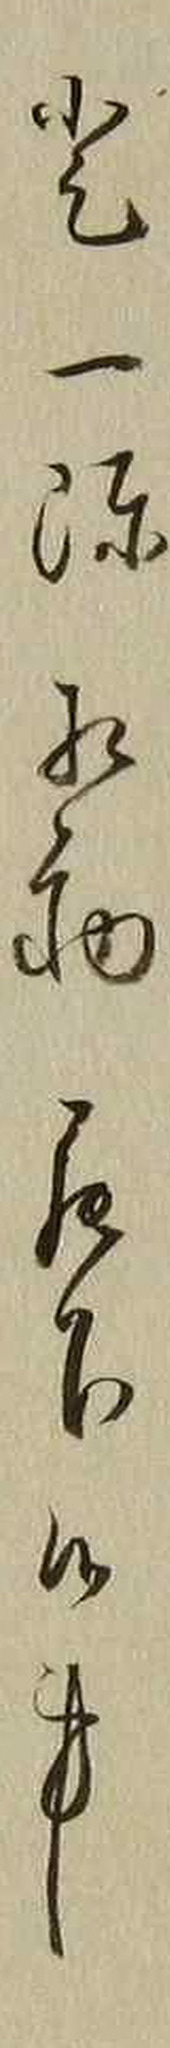登一陣相勤罷下候事
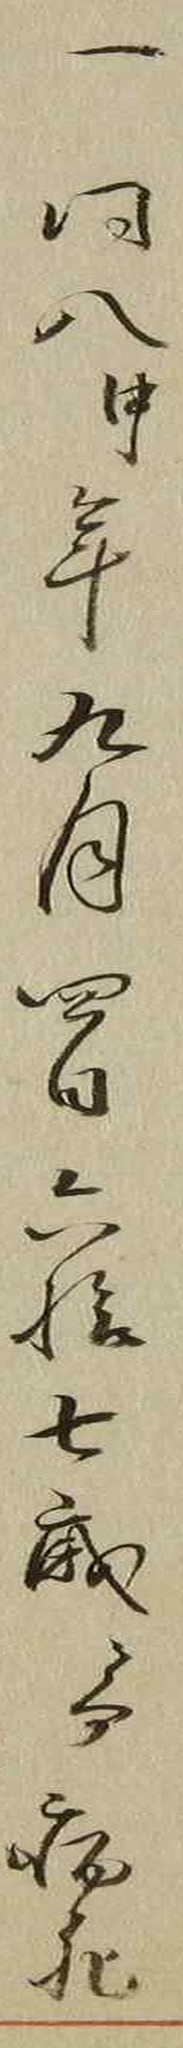一同八申年九月四日六拾七歳ニ而病死
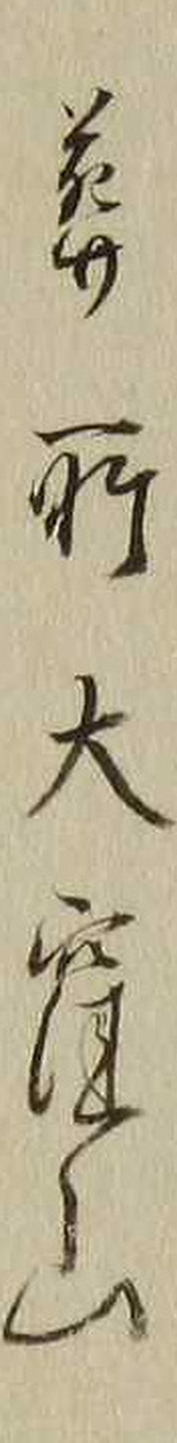葬所大窪山
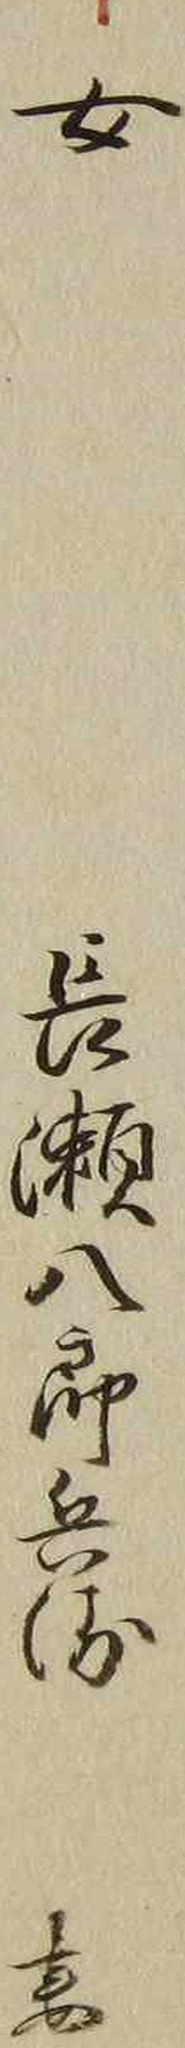女長瀬八郎兵衛妻
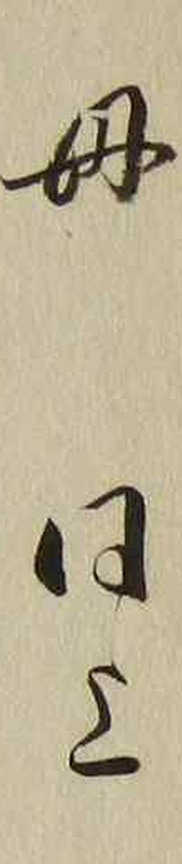母同上
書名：諸士系譜　巻之32　い之部32
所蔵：会津若松市立会津図書館
